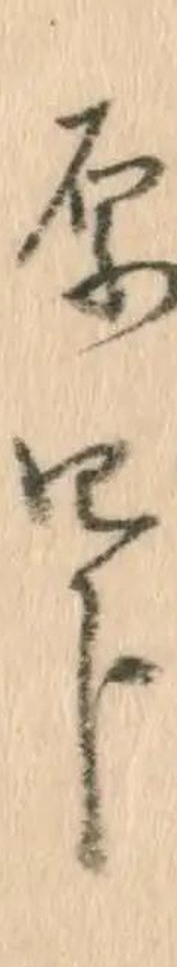厚四分
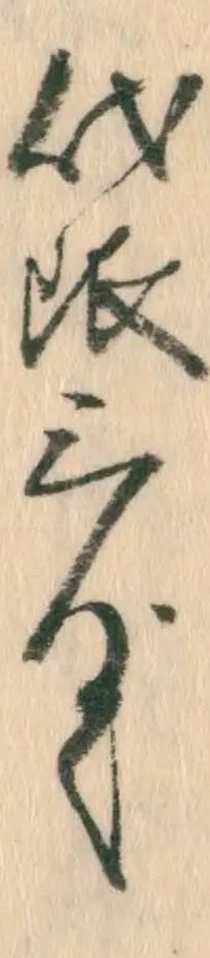代銀三匁但壱枚銀六分
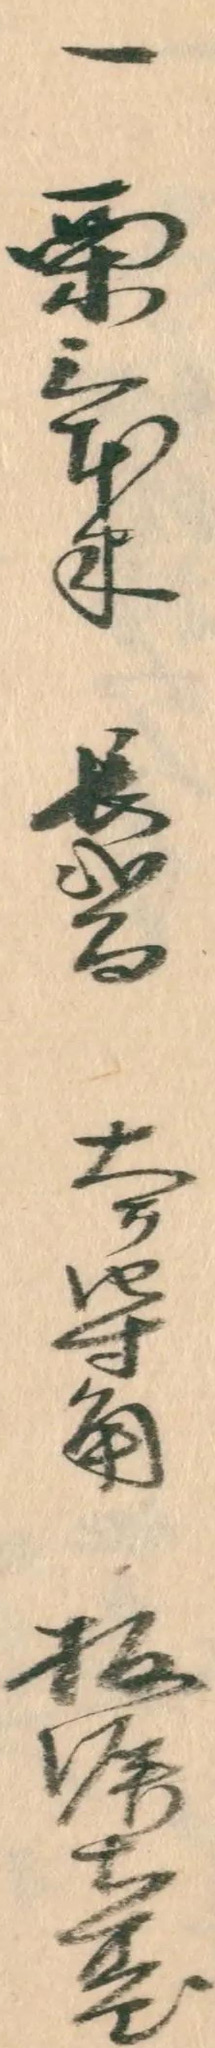一栗三本半長弐間大サ四寸角板塀土台
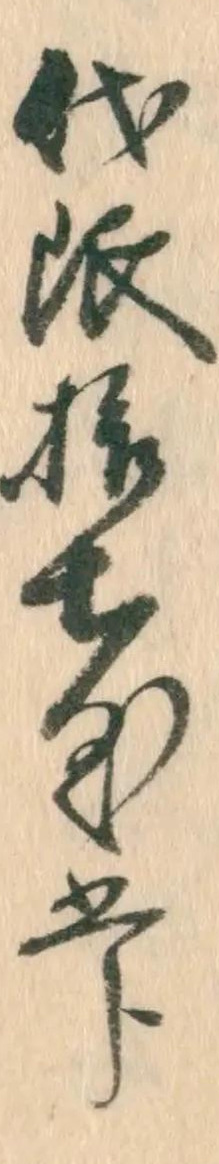代銀壱匁五分
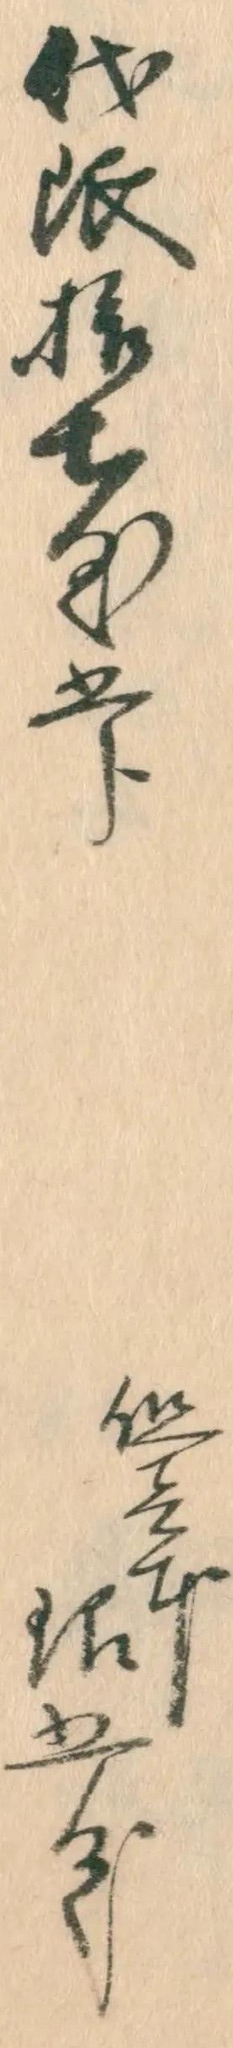代銀拾七匁五分但壱本銀五匁
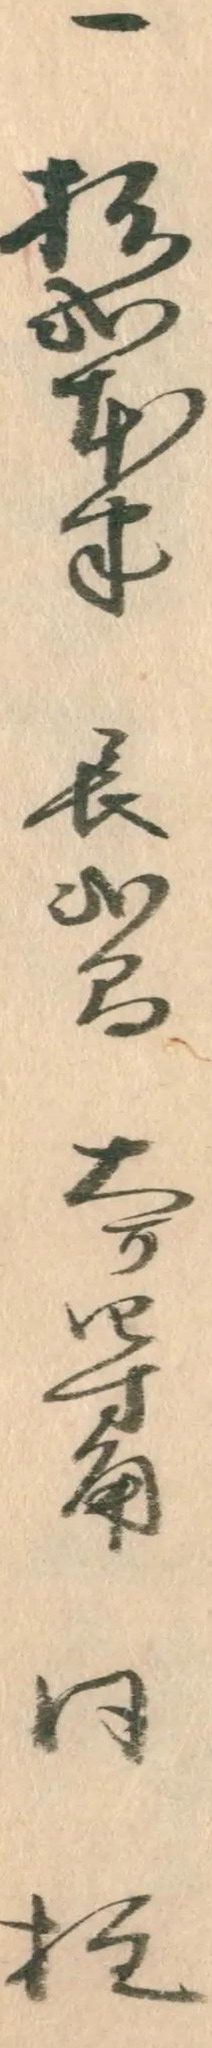一杉弐本半長弐間大サ四寸角同柱

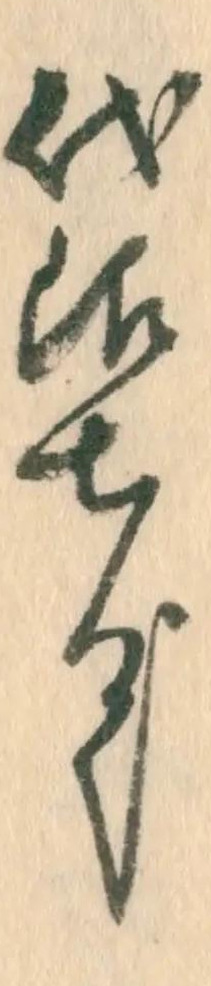代銀六拾匁但壱人銀五匁
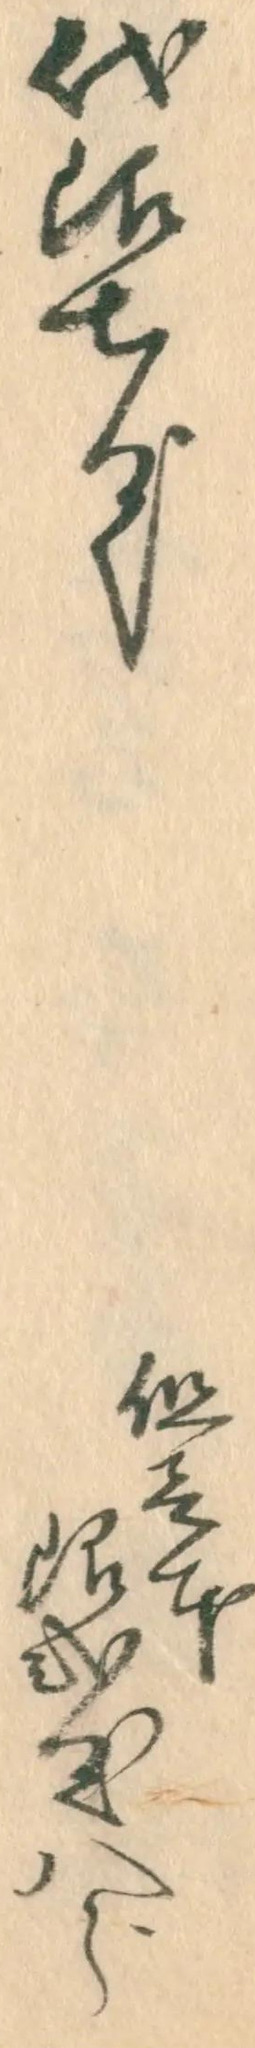代銀七匁但壱本銀弐匁八分
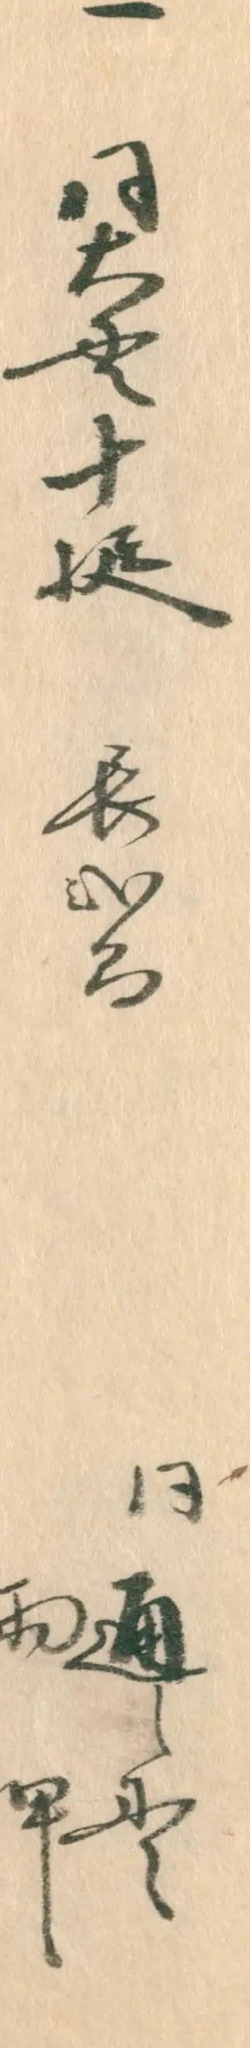一同大貫十挺長弐間同通し貫
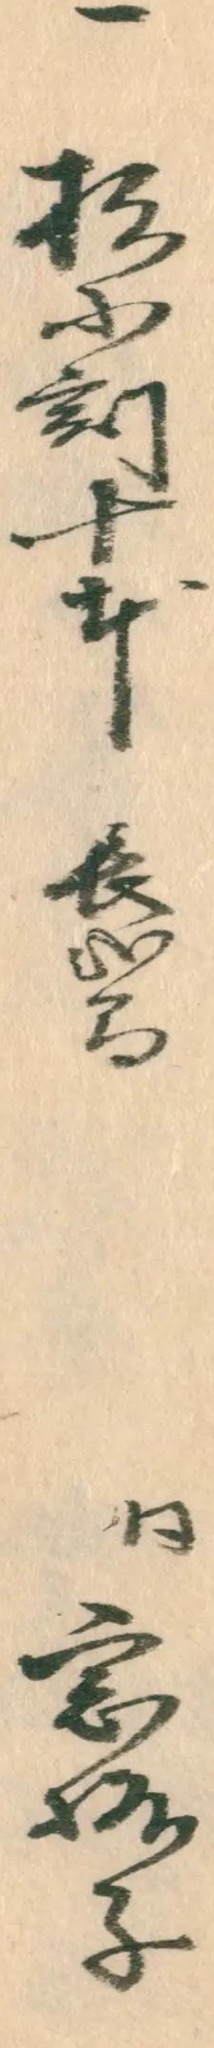一杉小割十本長弐間同窓格子
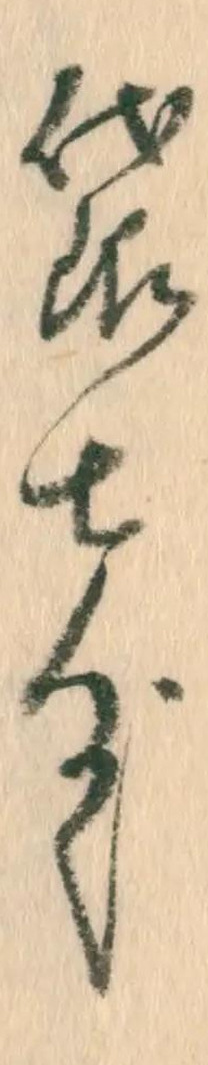代銀七匁但壱本銀七分
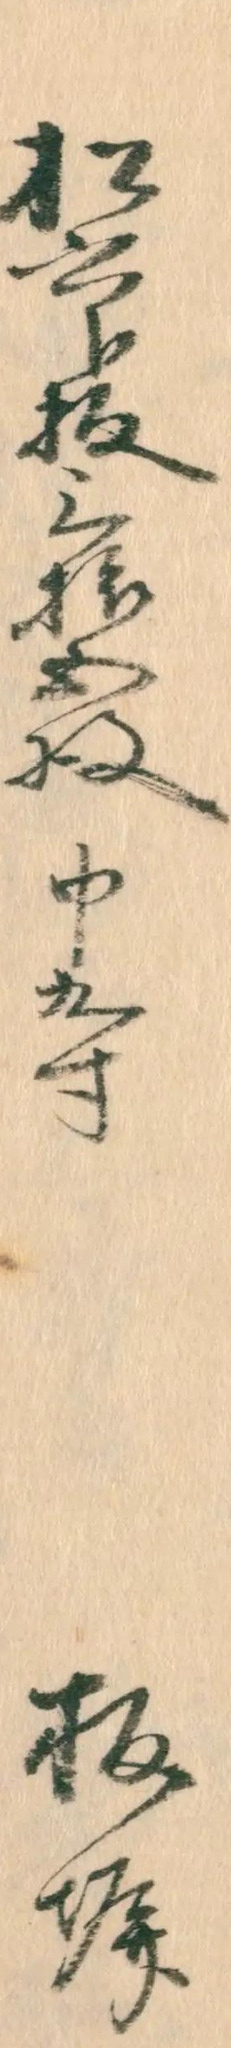一松六分板三拾五枚巾九寸板塀
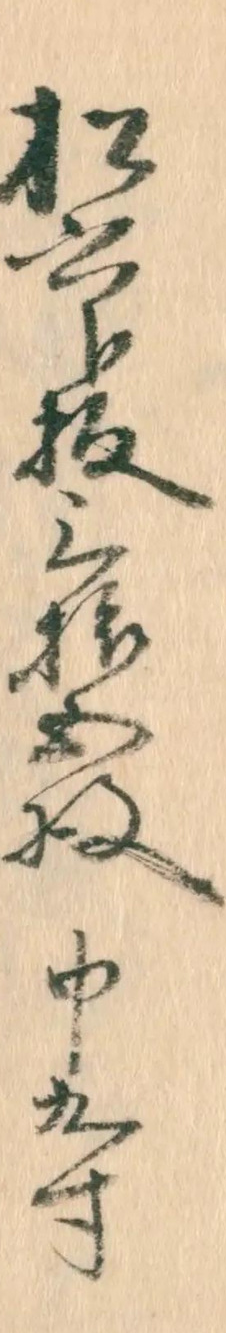一松六分板三拾五枚巾九寸板塀
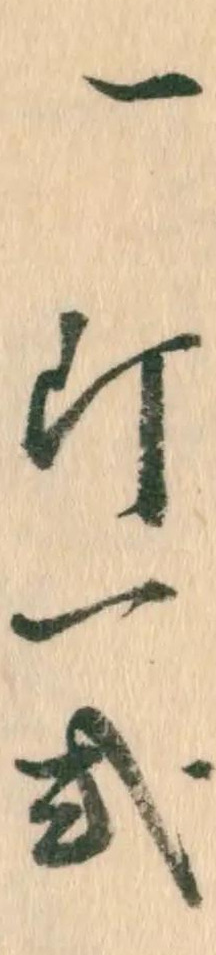一釘一式
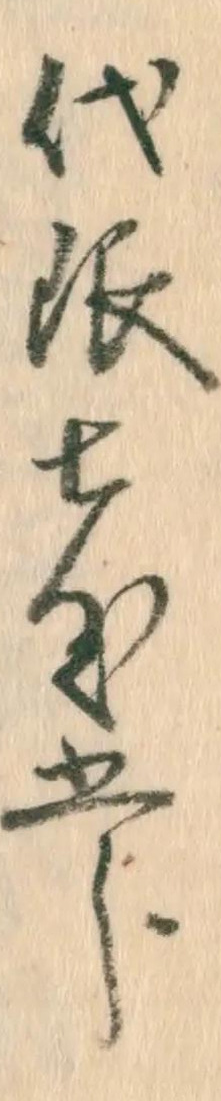代銀七匁五分
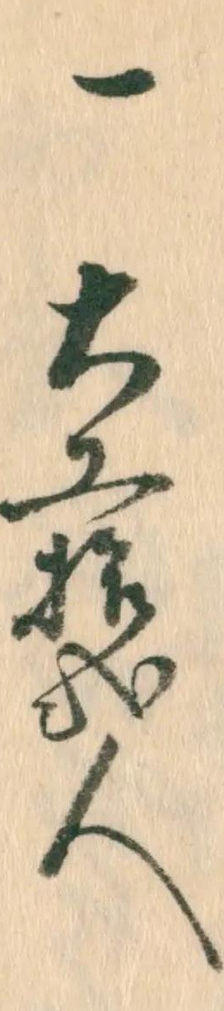一大工拾弐人
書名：三橋 17巻. [7] 三橋小破御修復書留　但御奉行御掛リ替地震潰橋番屋　嘉永四亥年より安政二卯年迄　上
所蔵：国立国会図書館 National Diet Library, JAPAN
